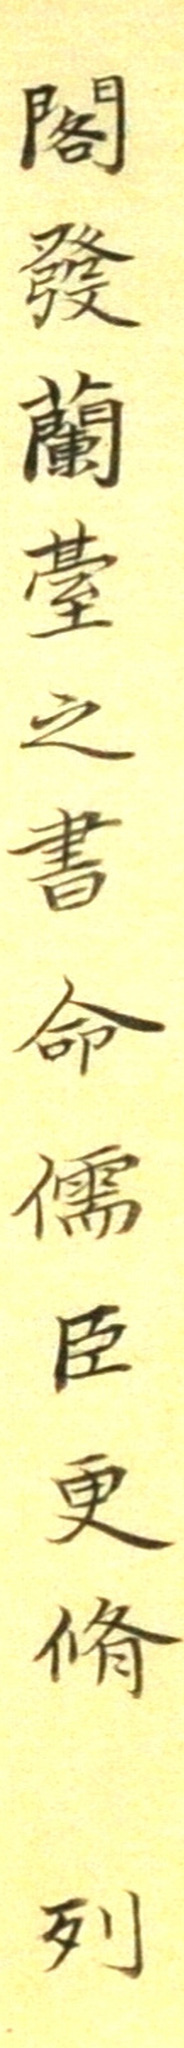閣発蘭台之書命儒臣更脩列
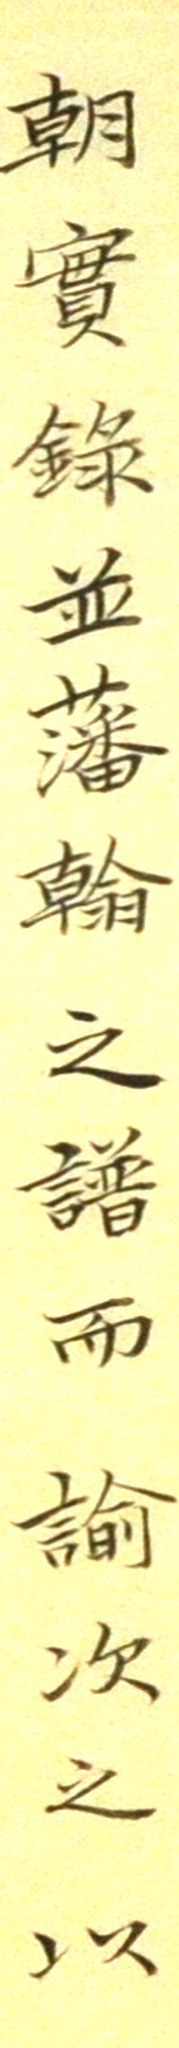朝実録並藩翰之譜而諭次之以
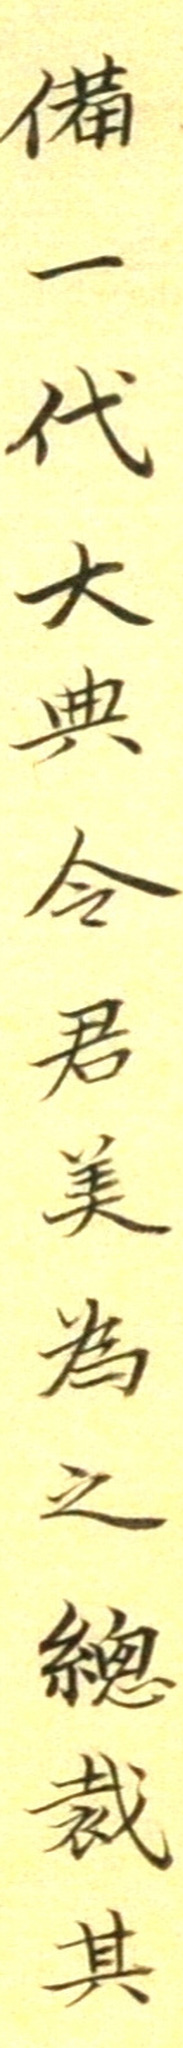備一代大典令君美為之総裁其
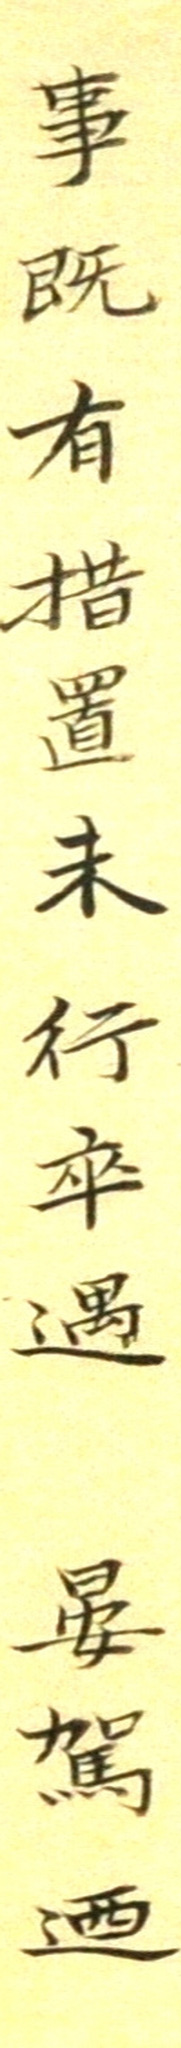事既有措置未行卒遇晏駕廼
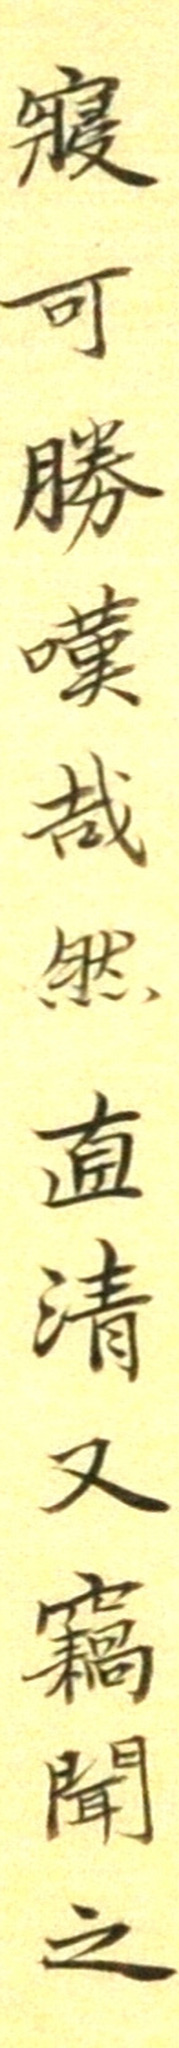寝可勝嘆哉然直清又窃聞之
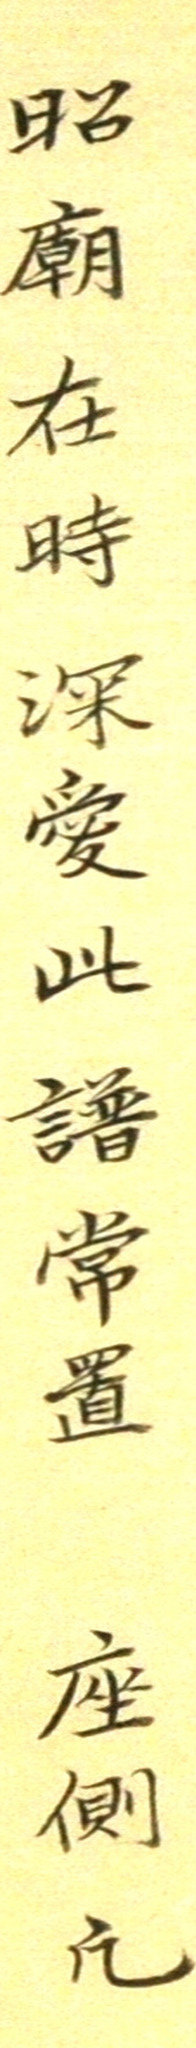昭廟在時深愛此譜常置座側凡
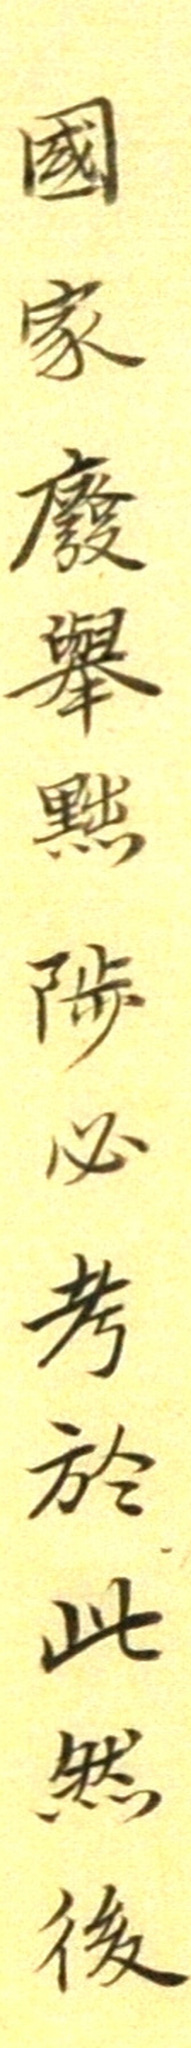国家廃挙黙陟必考於此然後

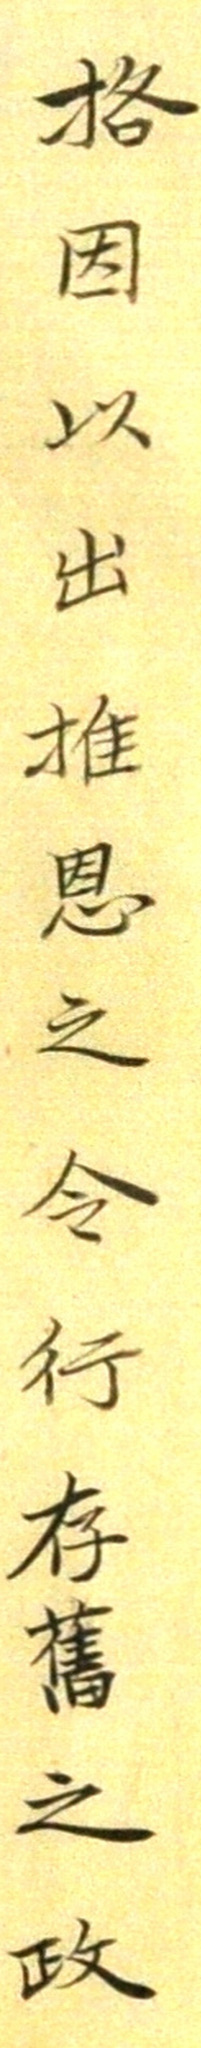挌因以出推恩之令行存旧之政
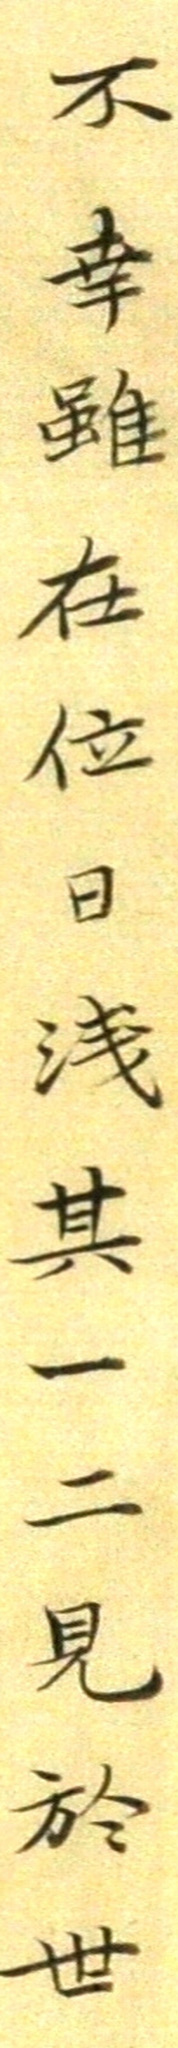不幸雖在位日浅其一二見於世
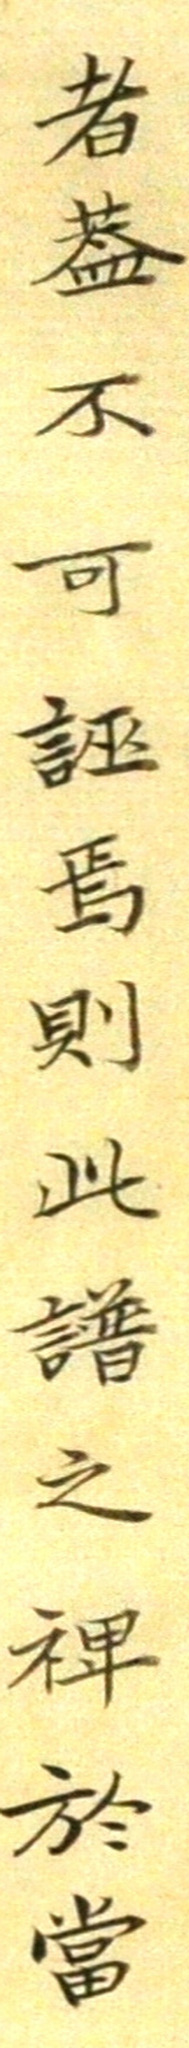者葢不可誣焉則此譜之裨於当
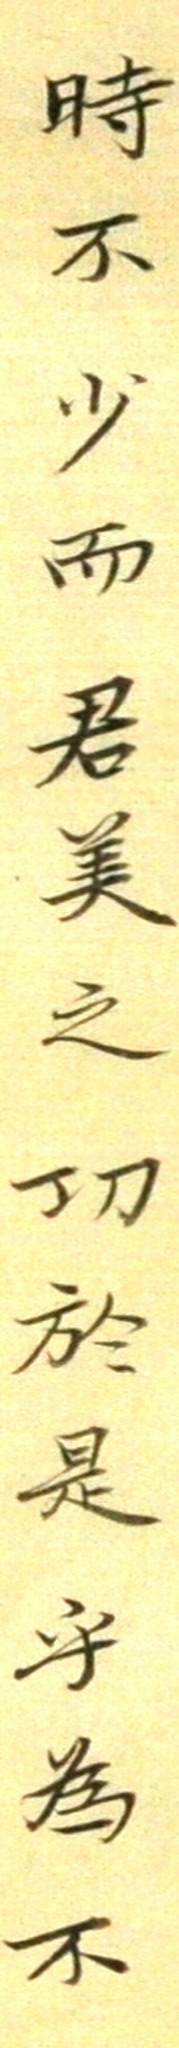時不少而君美之功於是乎為不
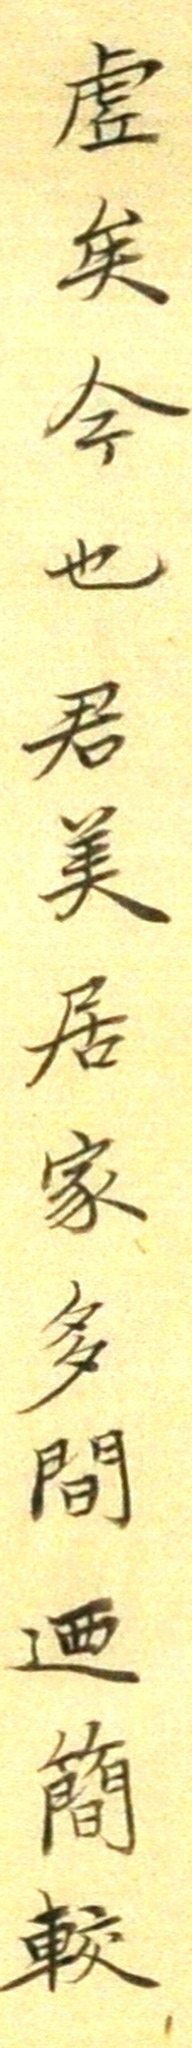虚矣今也君美居家多間廼簡較
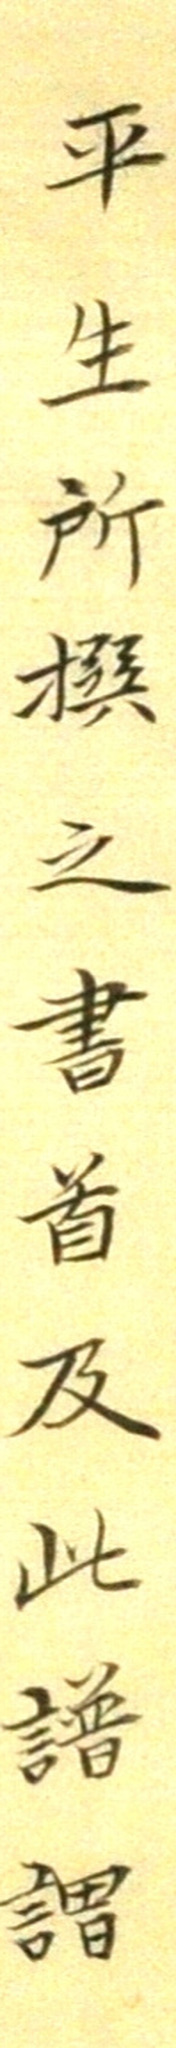平生所撰之書首及此譜謂
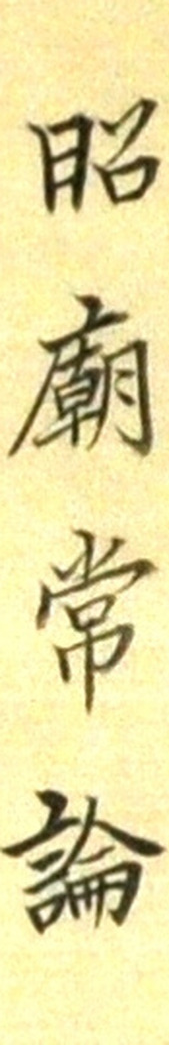昭廟常論
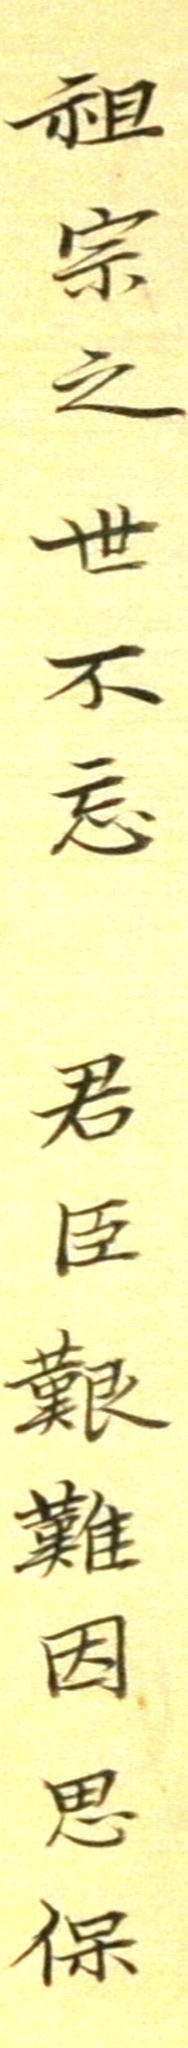祖宗之世不忘君臣艱難因思保
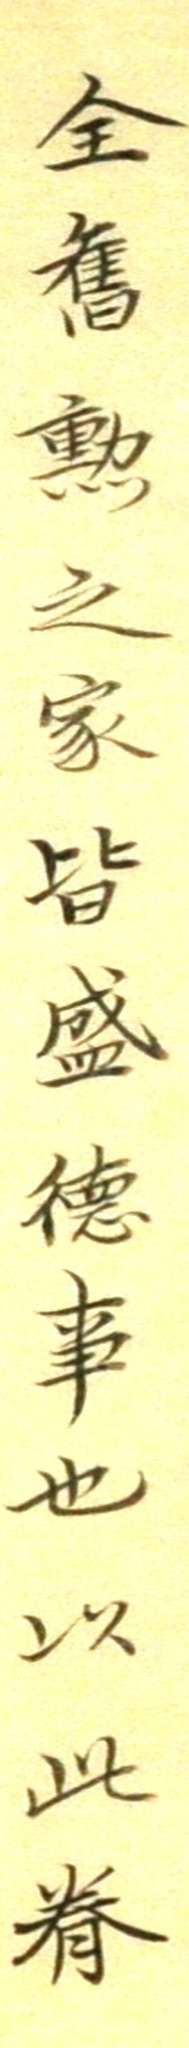全旧勲之家皆盛徳事也以此眷
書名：藩翰譜（一）
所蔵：伊那市立高遠町図書館・合同会社AMANE
